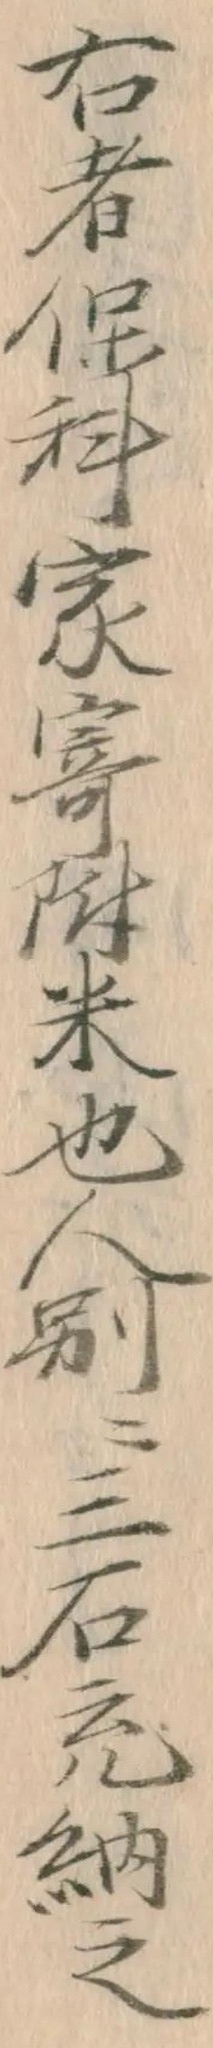右者保科家寄附米也人別ニ三石充納之
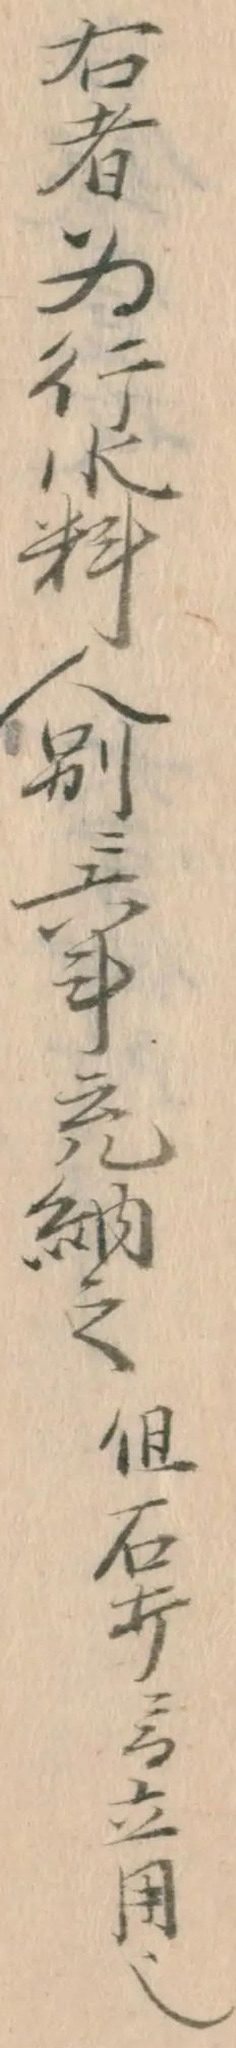右者為行水料人別ニ六斗充納之但石打ニ而立用也
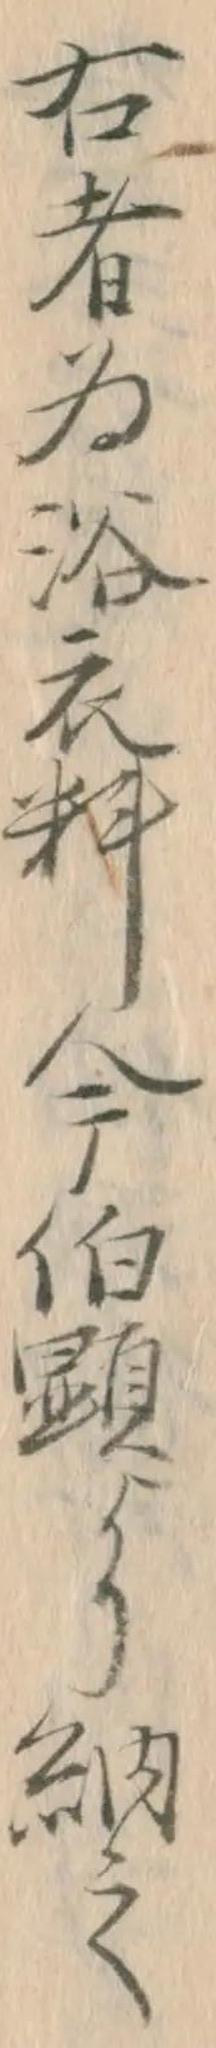右者為浴衣料今伯顕より納之

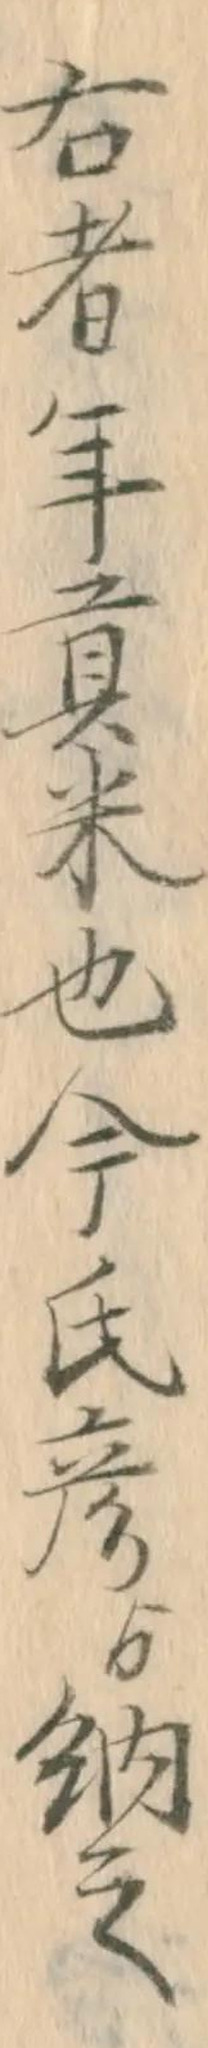右者年貢米也今氏彦ゟ納之
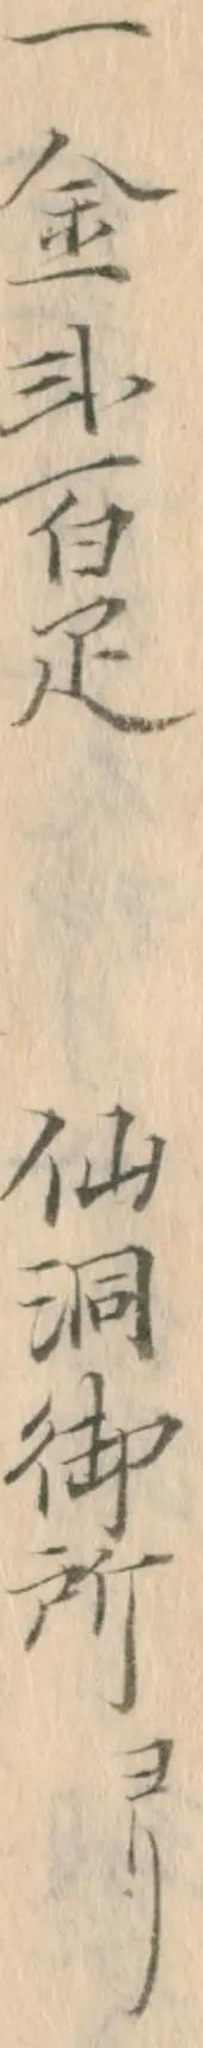一金弐百疋仙洞御所ヨリ
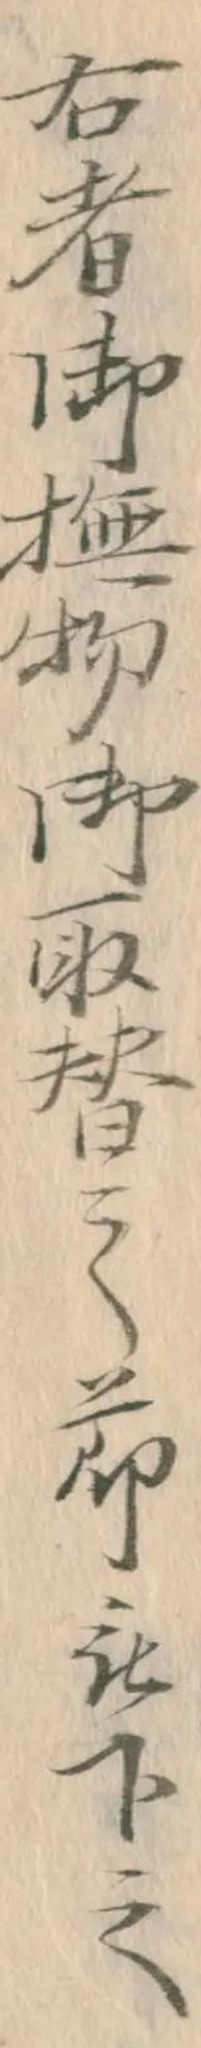右は御撫物御取替之節被下之
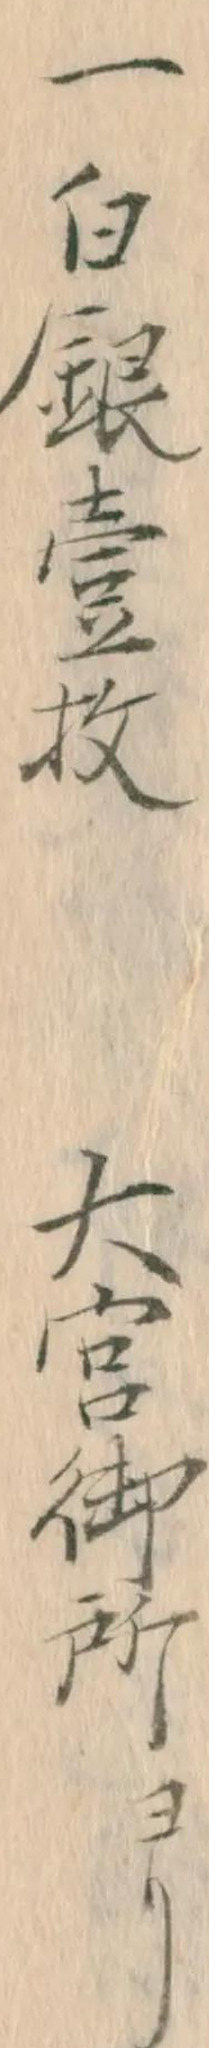一白銀壱枚大宮御所ヨリ
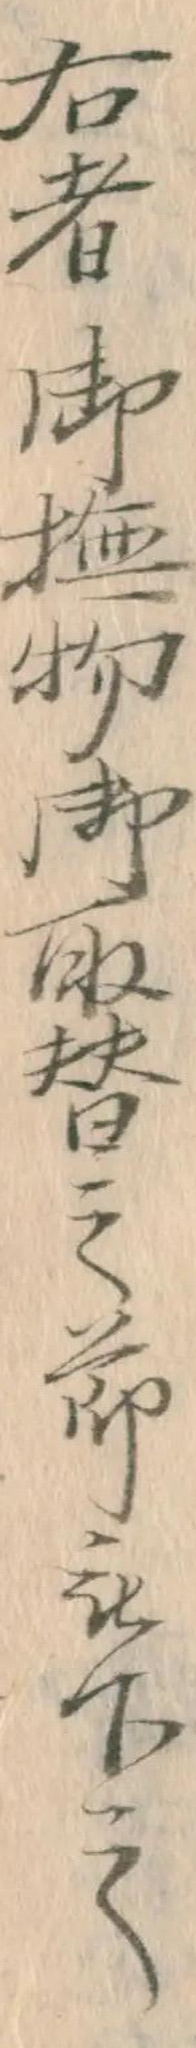右は御撫物御取替之節被下之
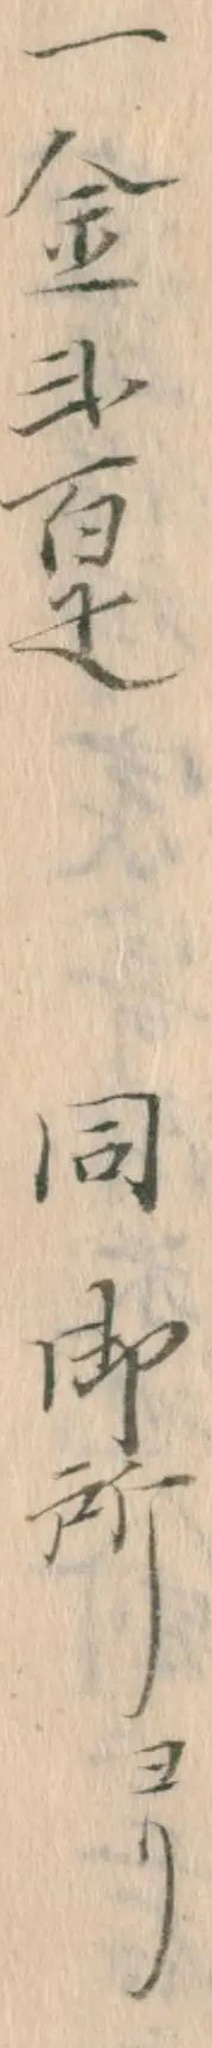一金弐百疋同御所ヨリ
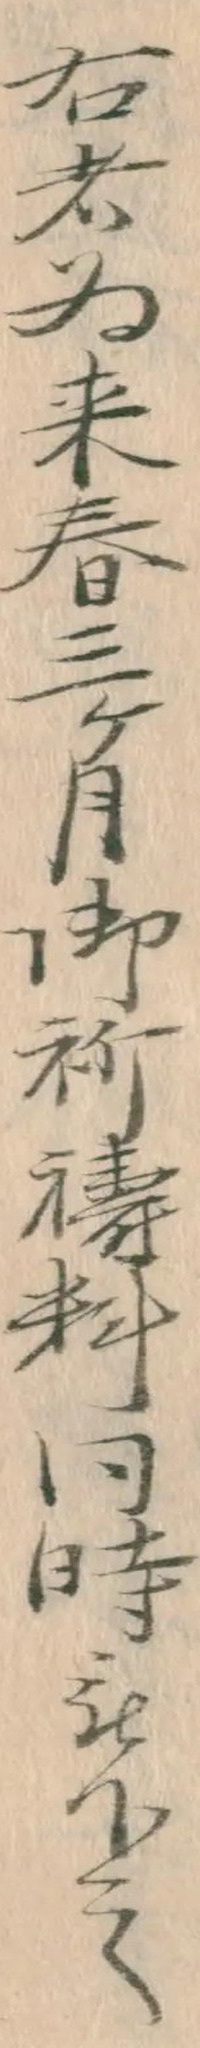右者為来春三ヶ月御祈祷料同時被下之
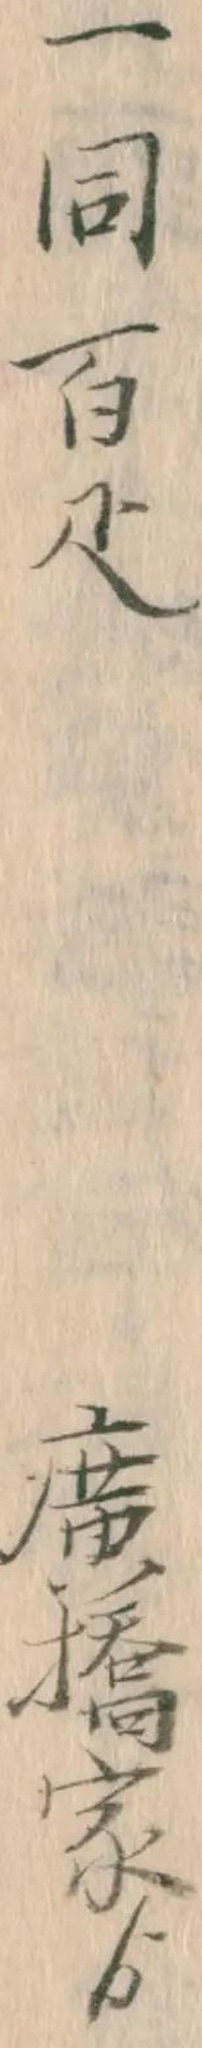一同百疋廣橋家ゟ
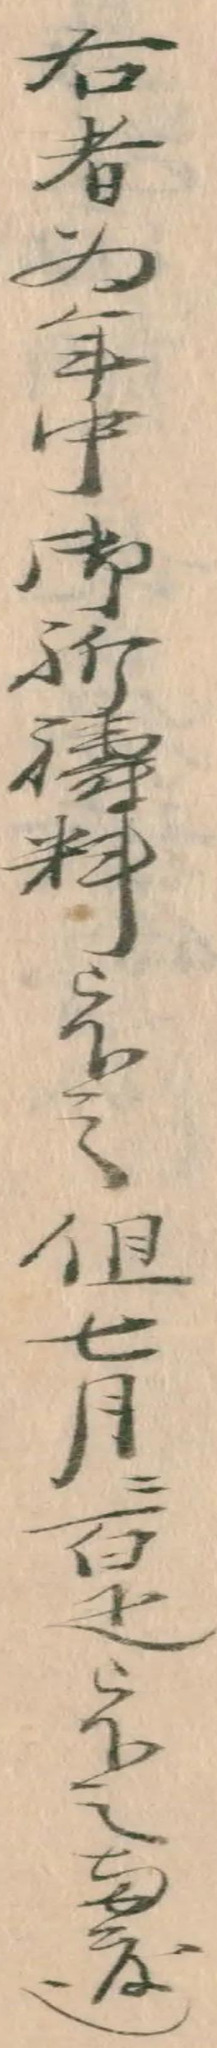右者為年中御祈祷料被下之但七月ニ百疋被下候両度也
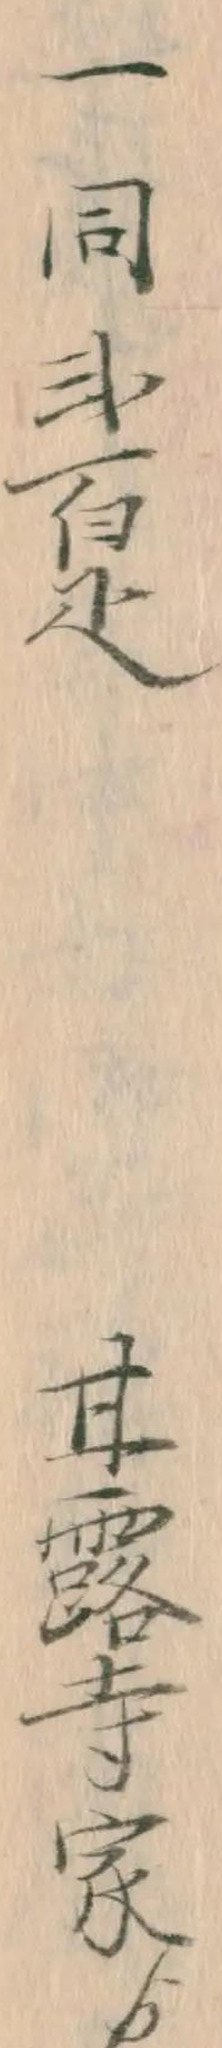一同弐百疋甘露寺家ゟ
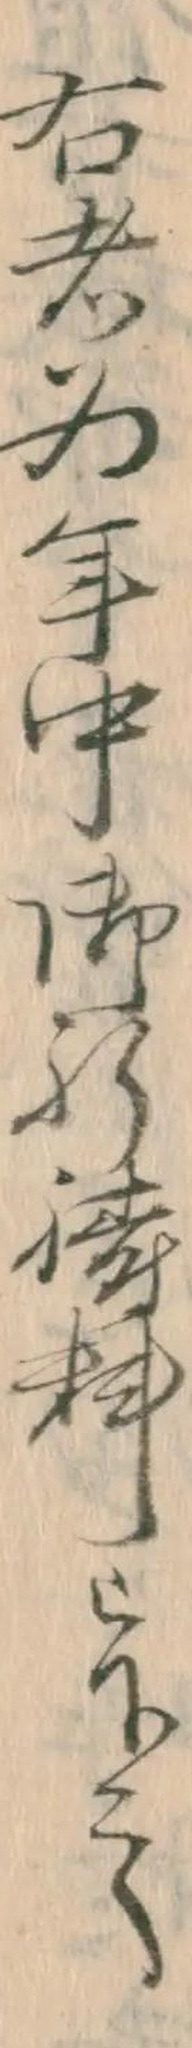右は為年中御祈祷料被下之
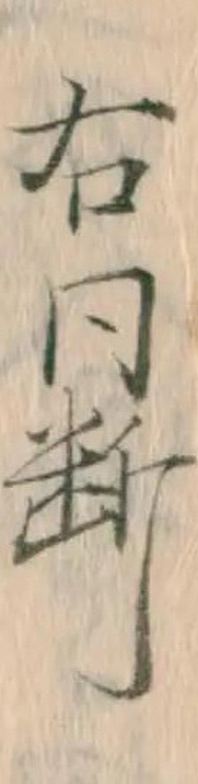右同断
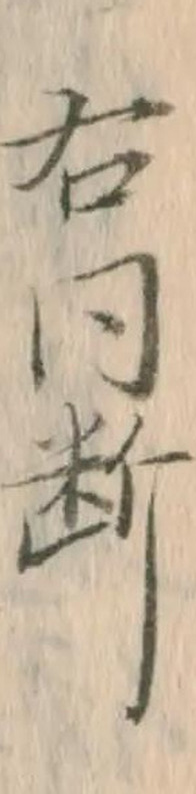右同断
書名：賀茂社記録. 第74冊
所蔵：国立国会図書館 National Diet Library, JAPAN
